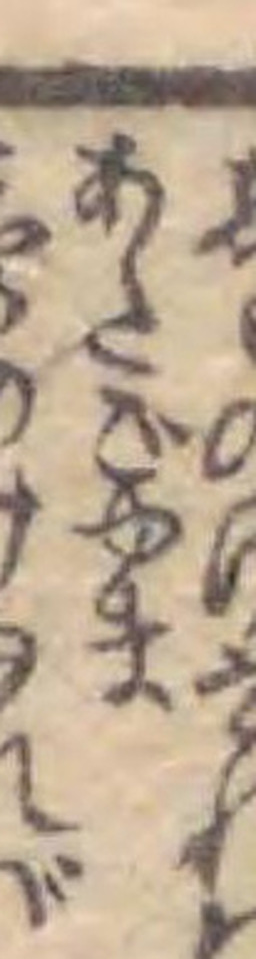しかのけで
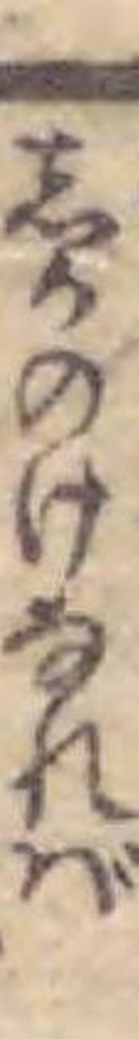しかのけなれば
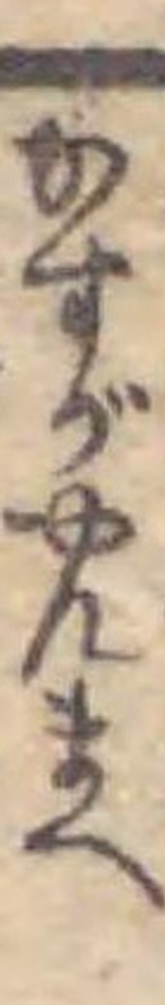かすがやんまへ
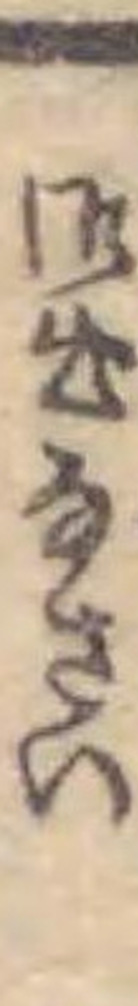お出なさい
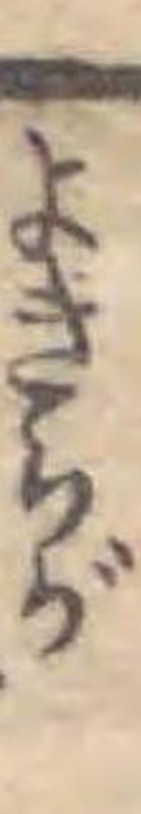よきちが
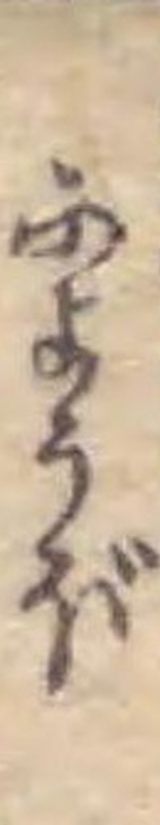にようぼ
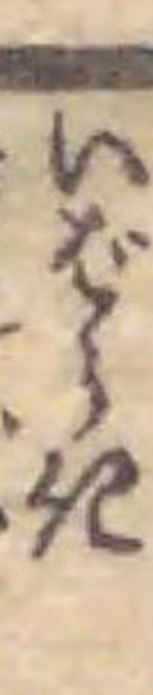いばらき
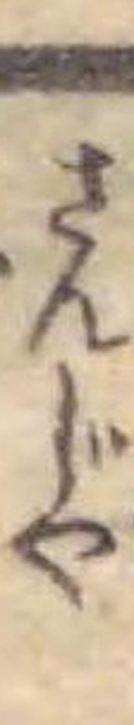さんじや
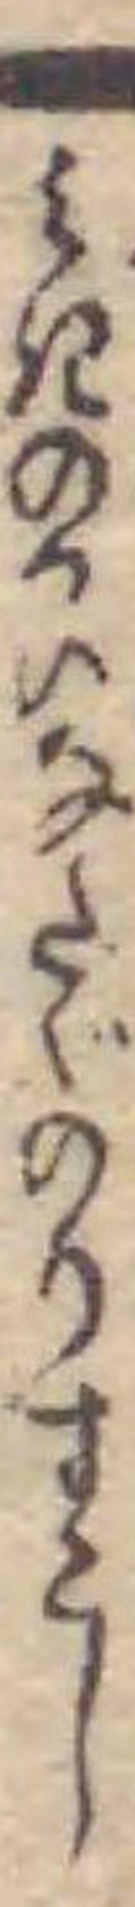みきのかいなたゞのりすこし
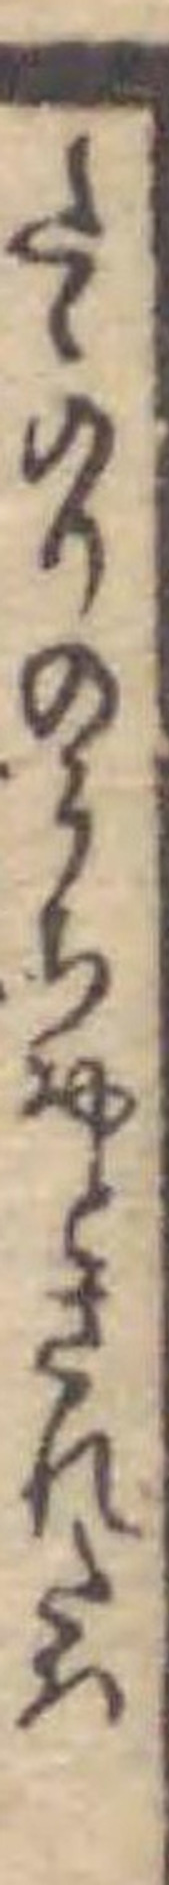たゝのりのうちおとされたは
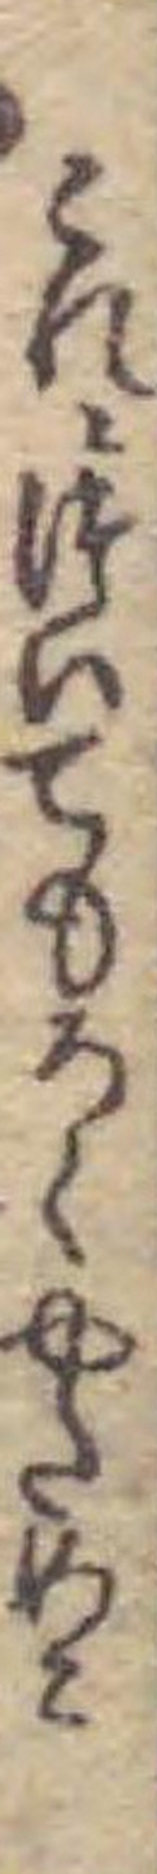これについてもろくやために
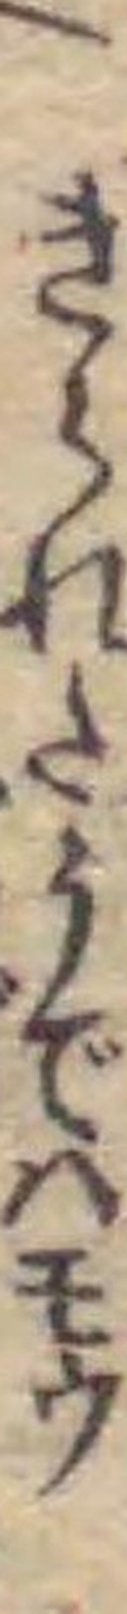きられたうではモウ
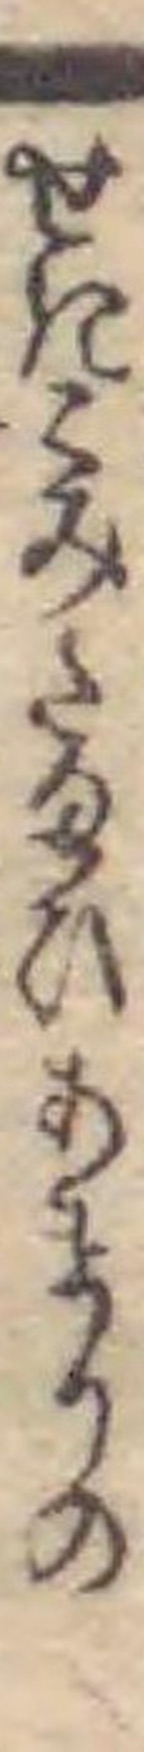せきこみたまひあまりの
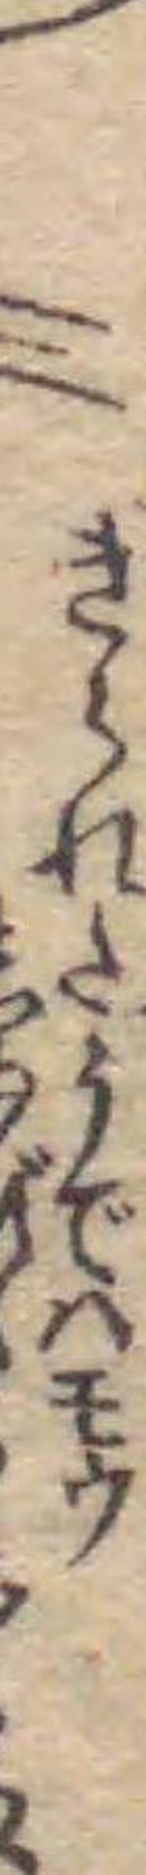きられたうではモウ
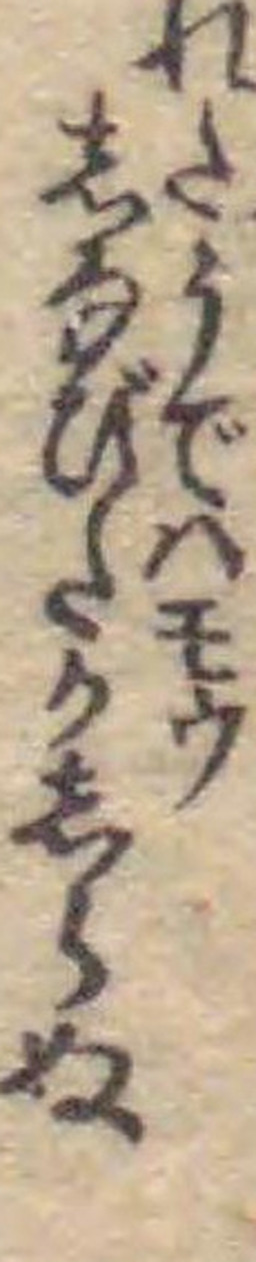しなびたかしらぬ
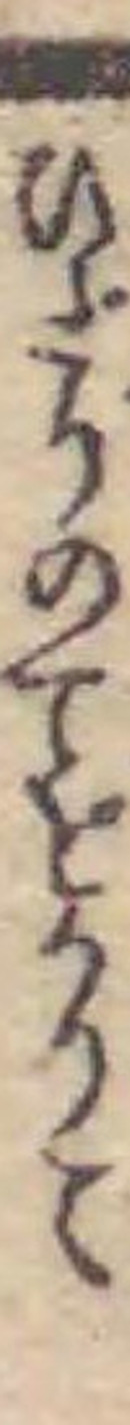ひだりのてをかりて
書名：大悲の千六本 : 1巻
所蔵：国立国会図書館 National Diet Library, JAPAN
